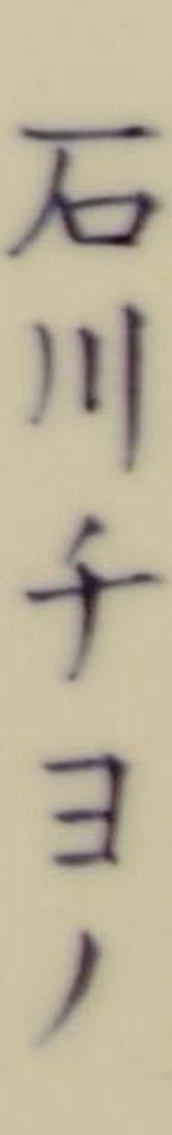石川チヨノ
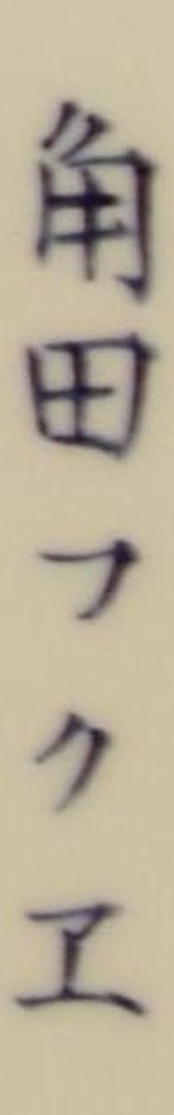角田フクヱ
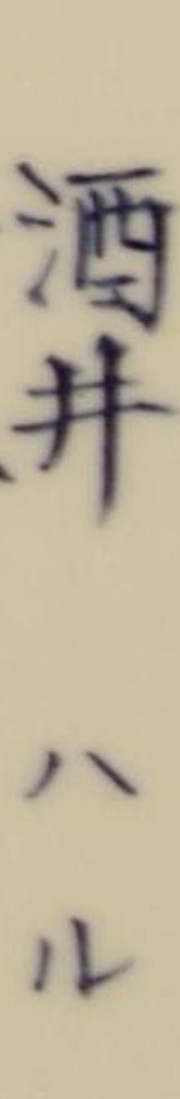酒井ハル
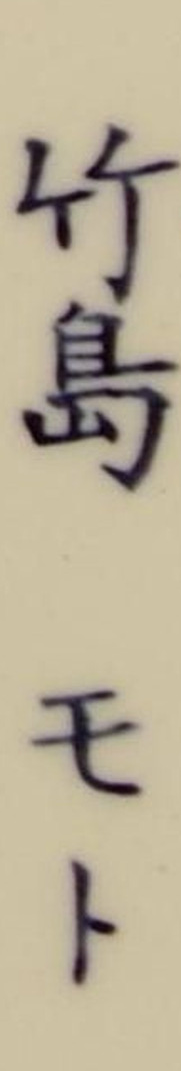竹島モト
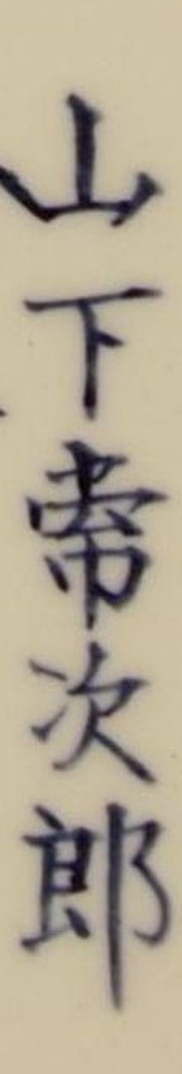山下常次郎
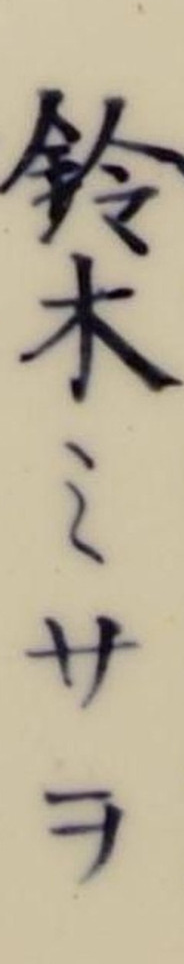鈴木ミサヲ
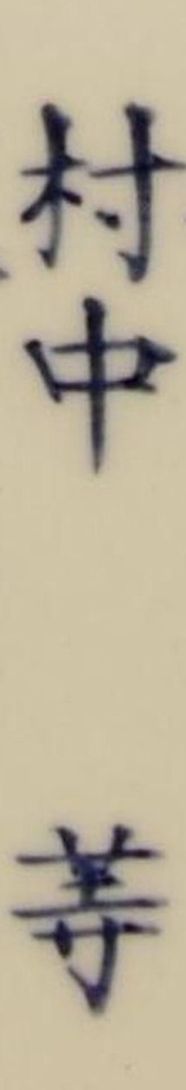村中等
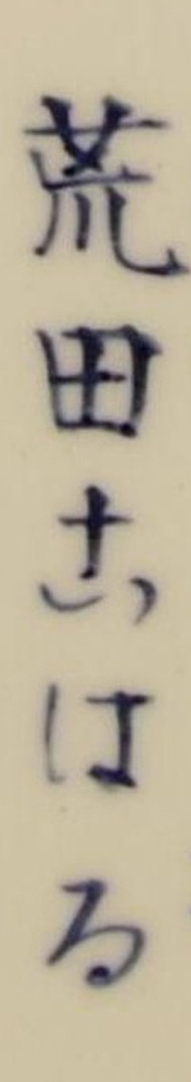荒田こはる
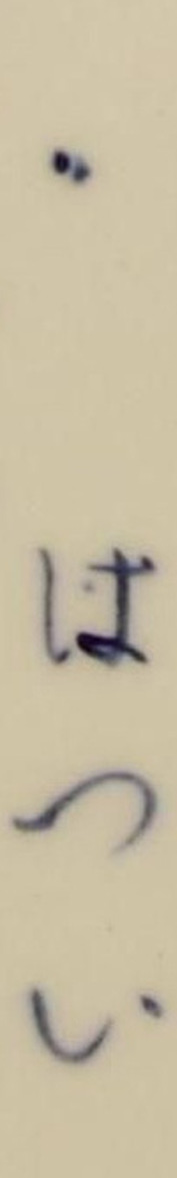はつい
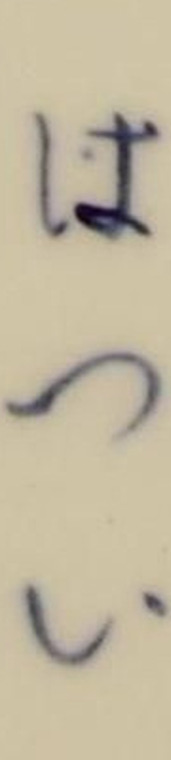はつい
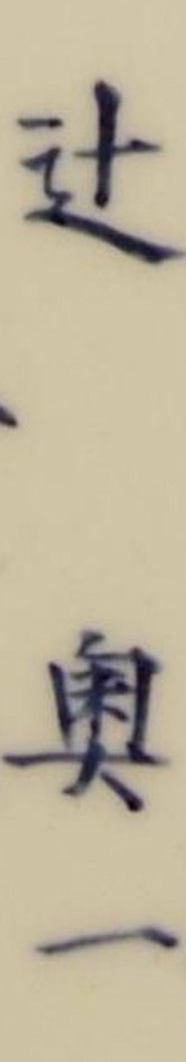辻奥一
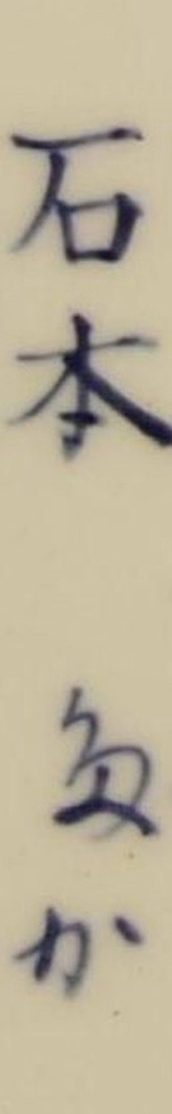石本たか
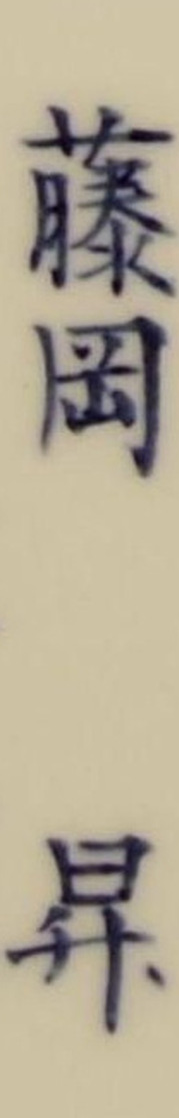藤岡昇
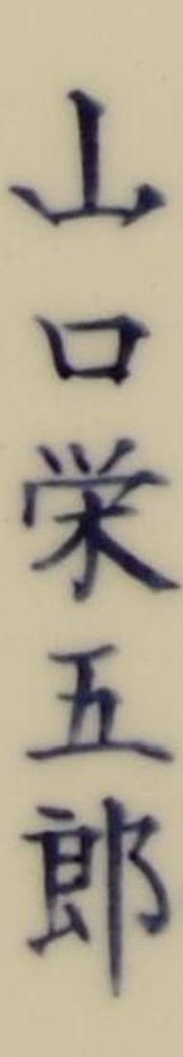山口栄五郎
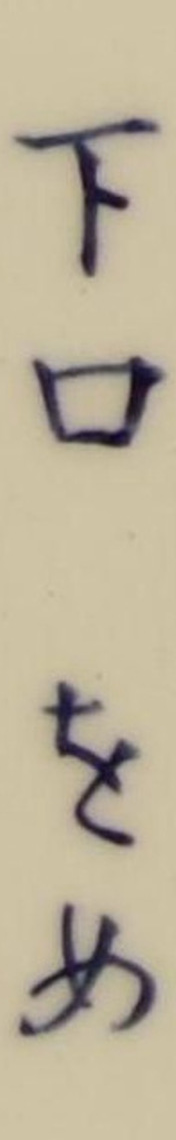下口をめ
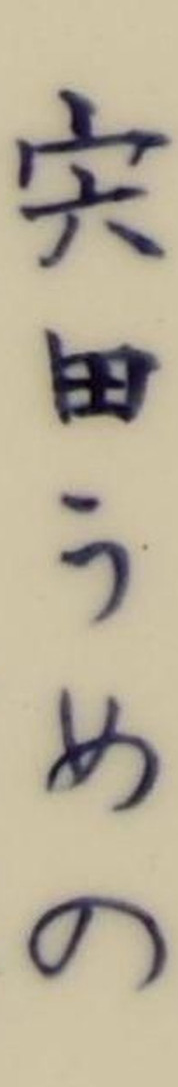宍田うめの
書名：E~L
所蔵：高野山金剛峯寺
